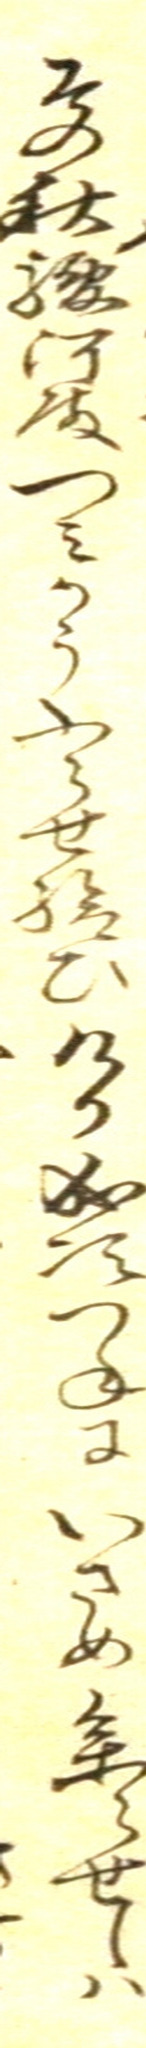その秋駿河殿つみかうふらせ給ひけり成次つねにいさめ参らせしは
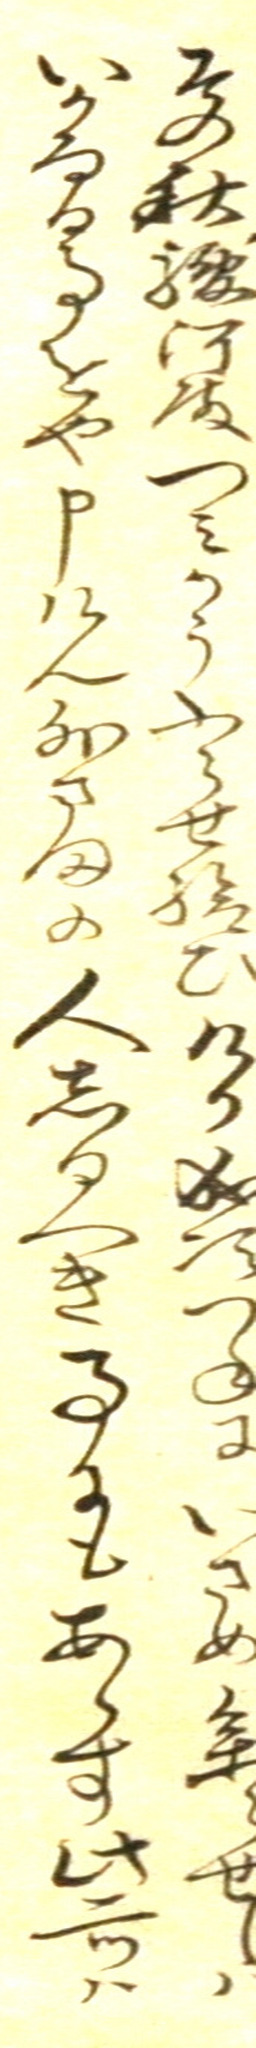いかなる事をや申けん外さまの人しるへき事にもあらす此二ツは

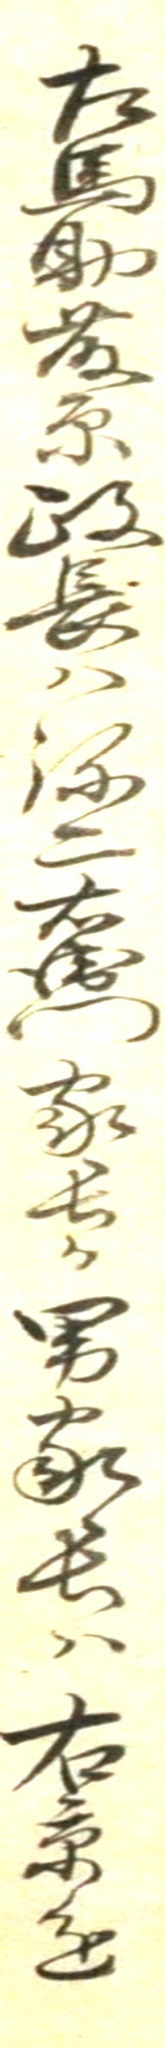左馬助藤原政長は弥二右衛門家長か男家長は右京進
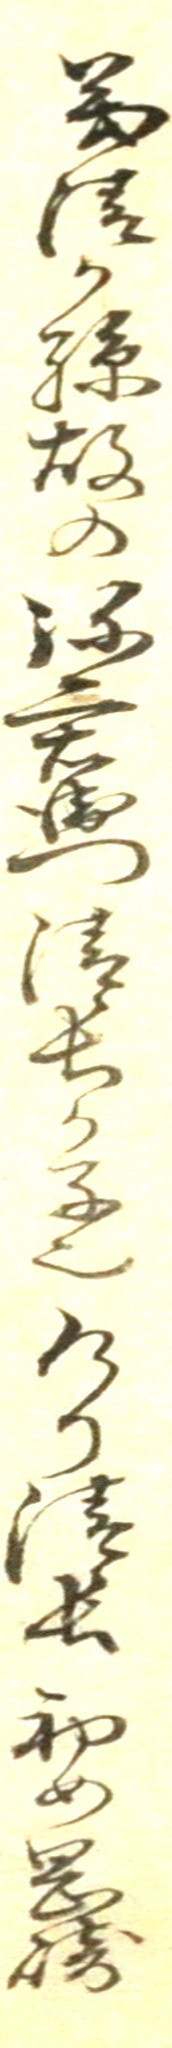義清か孫故の弥二右衛門清長か子也けり清長初め岡崎
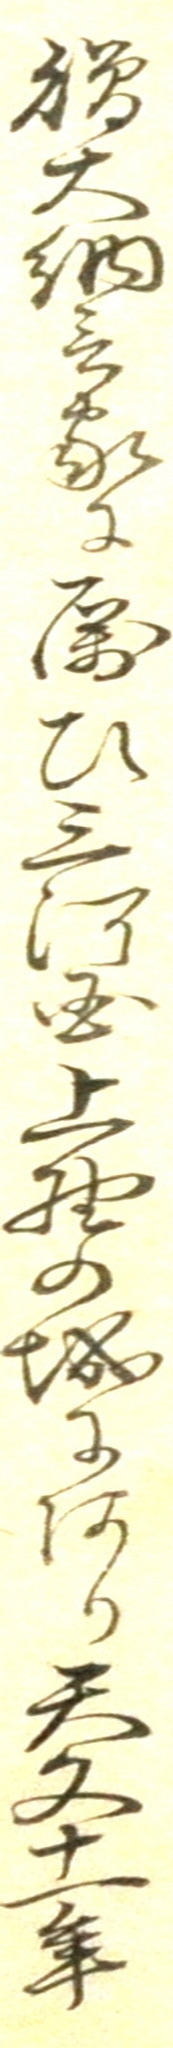贈大納言家に属ひ三河国上野の城にあり天文十一年
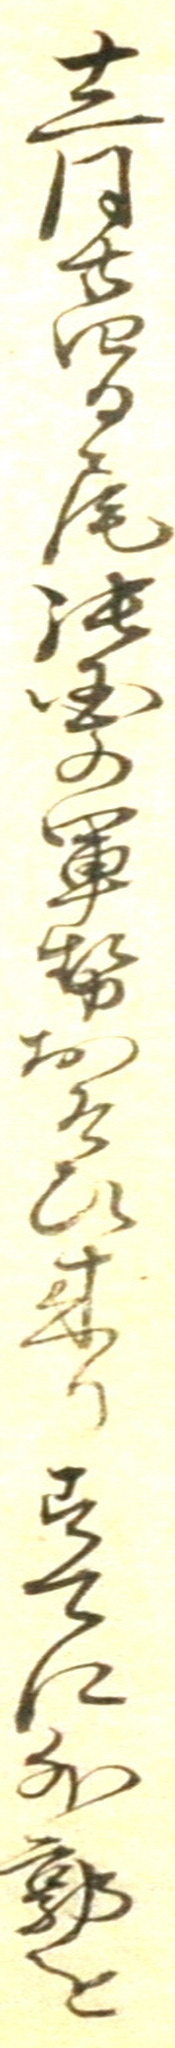十二月廿四日尾張国の軍勢おそひ来りすてに外郭を
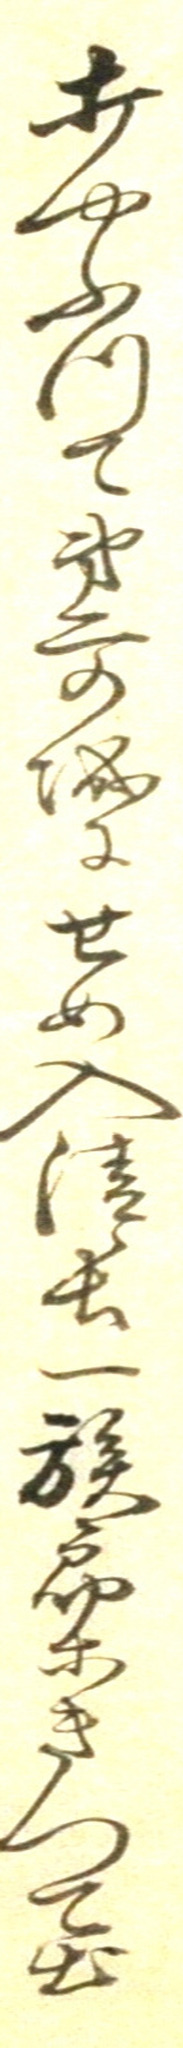打やふつて第二の城にせめ入清長一族郎等きつて出
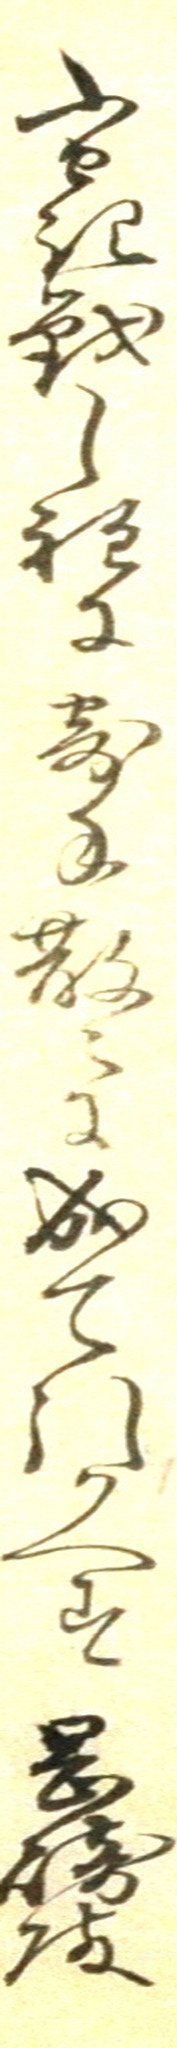ふせき戦し程に寄手散々に成て引かへす岡崎殿
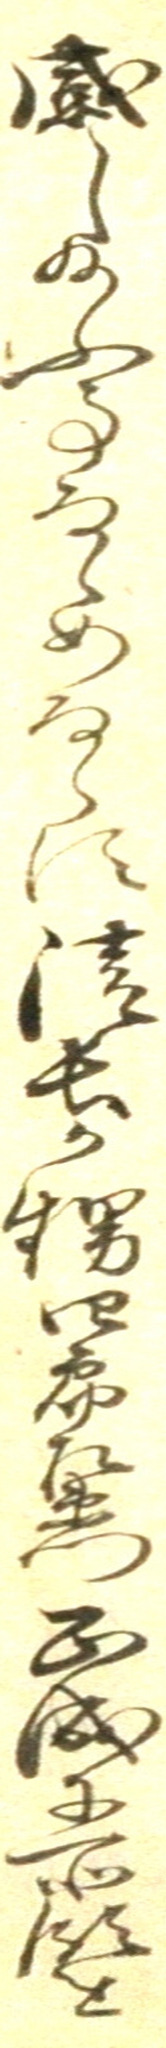感し給ふ事なゝめならす清長か甥四郎左衛門正成に所領を
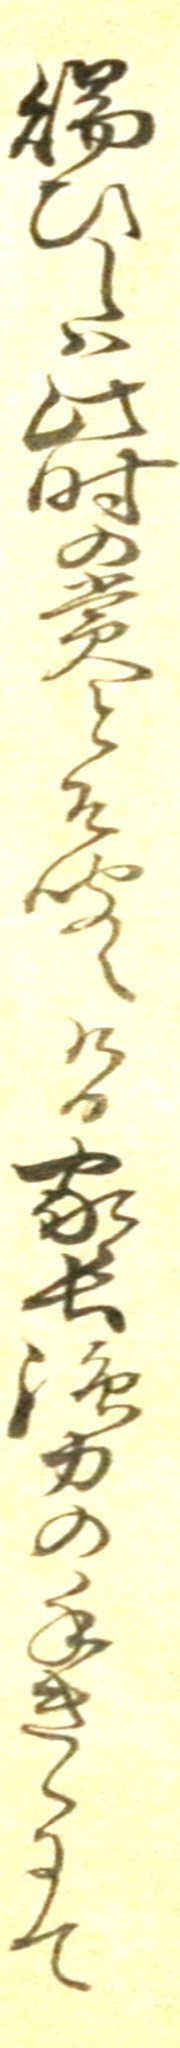賜ひしは此時の賞とそ聞ゝける家長強力の手きゝにて
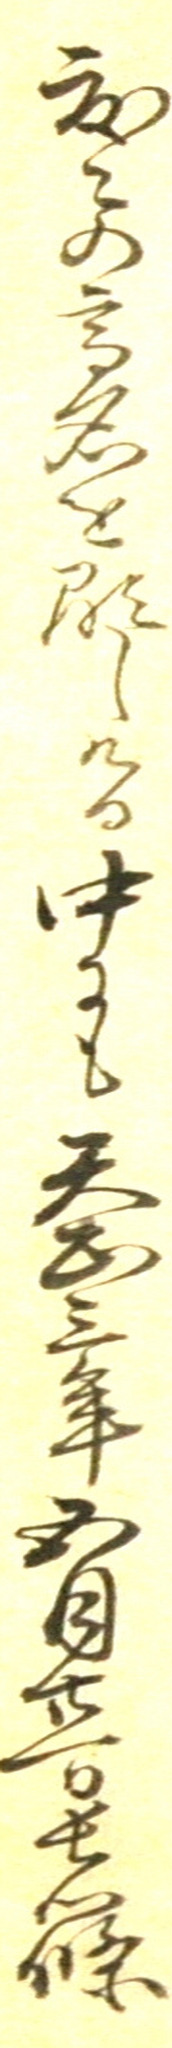度々の高名を顕しける中にも天正三年五月廿一日長篠

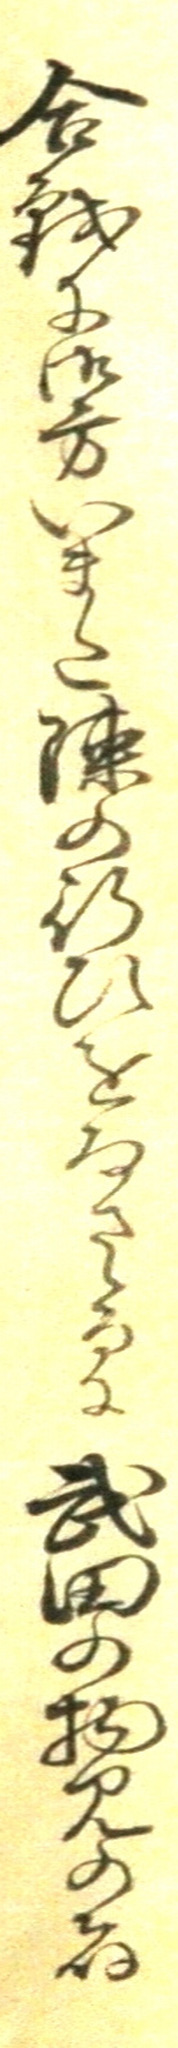合戦に御方いまた陳の行ひをなさゝるに武田の物見の者
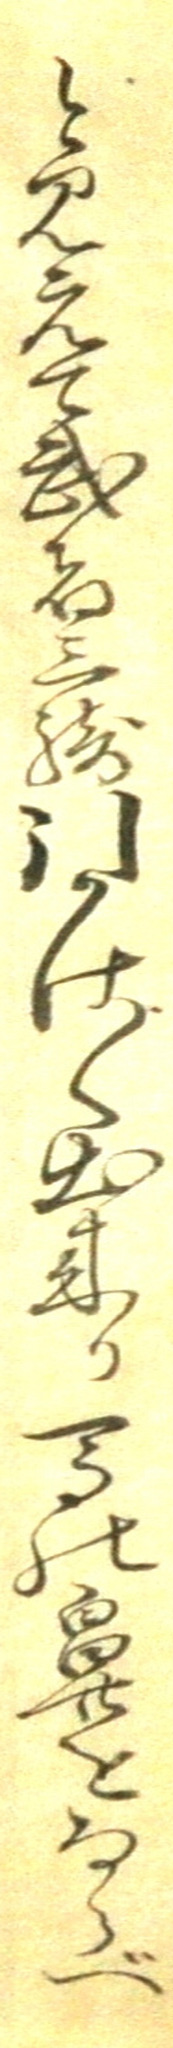と見えて武者三騎引かけ〳〵出来り馬の鼻をならべ
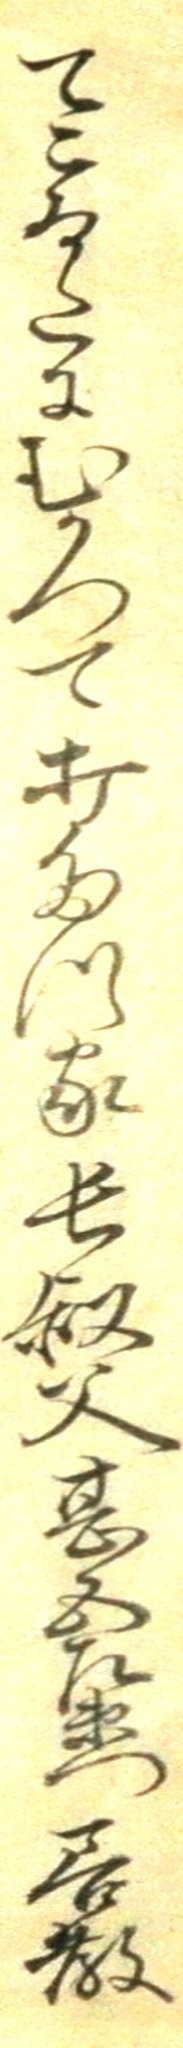てこなたにむかつて打たつ家長叔父甚五左衛門善教
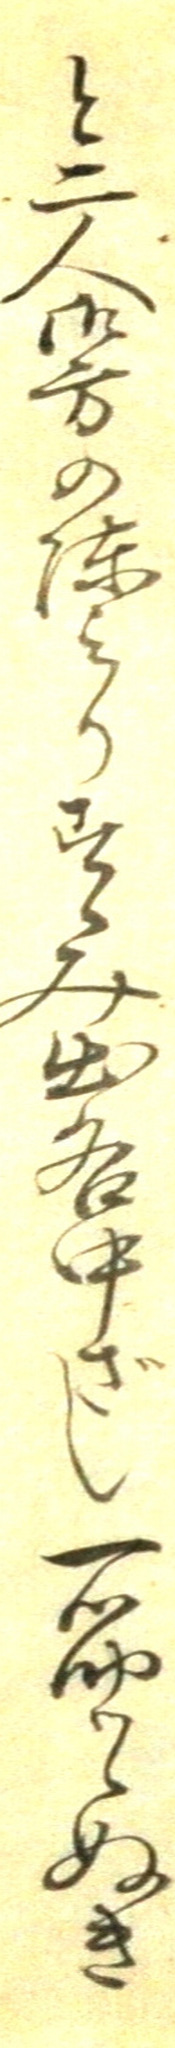と二人御方の陣よりすゝみ出各中ざし一筋ツヽぬき
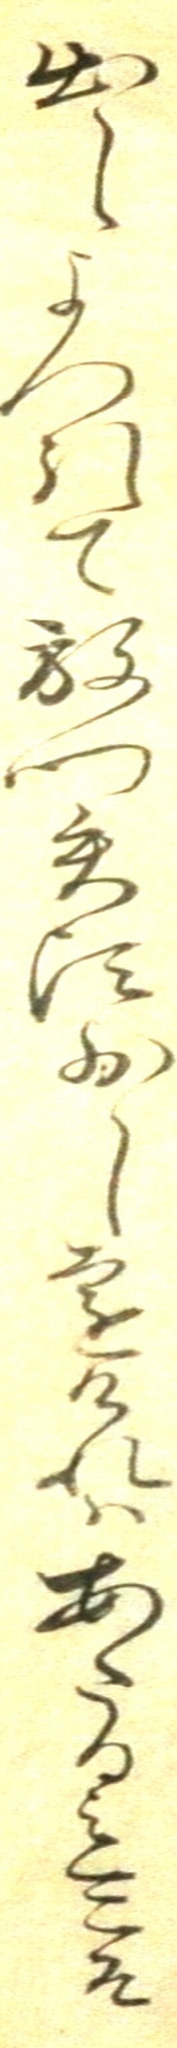出しよつ引て放つ矢頃少し遠けれはあたる迄こそ
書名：藩翰譜（四・中）
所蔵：伊那市立高遠町図書館・合同会社AMANE
